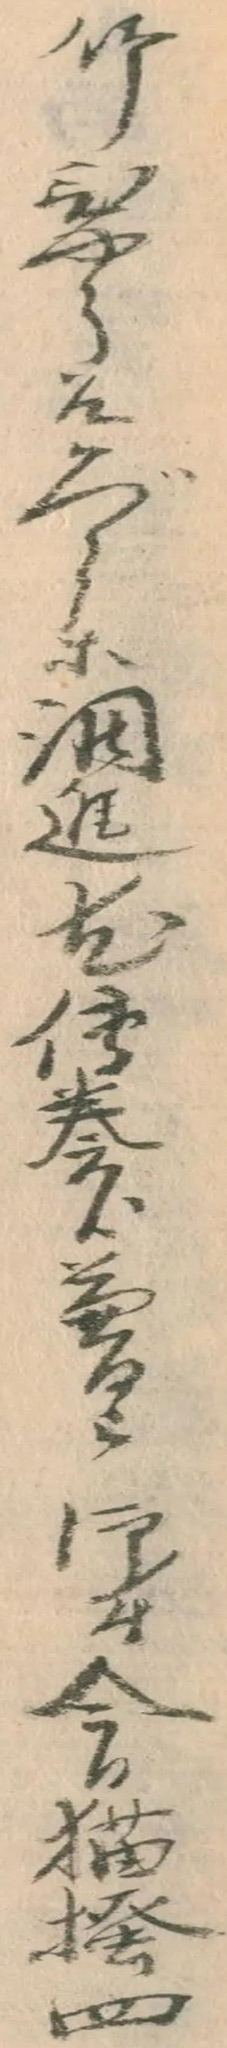仰ひやうそかづら等調進尤傳奏ゟ兼日被仰付今日猫搔四
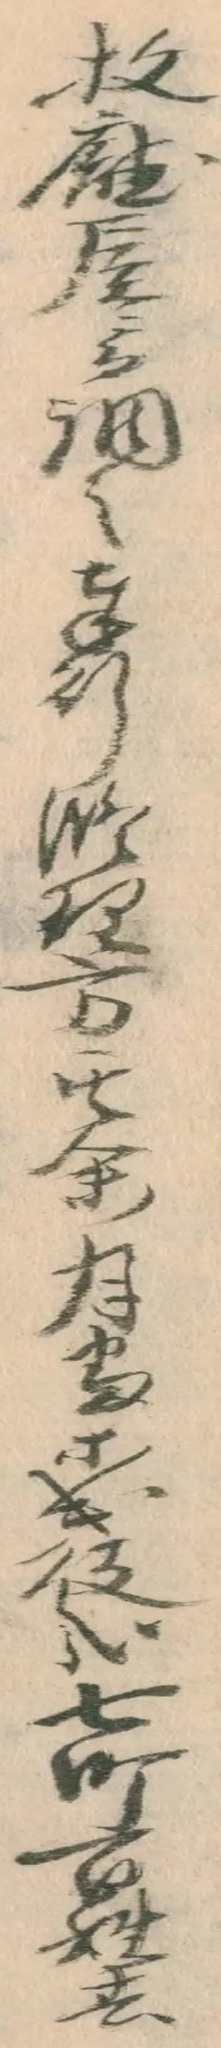牧廰屋ニ而調之奉行修理方其余月番等出役哉七町百姓共
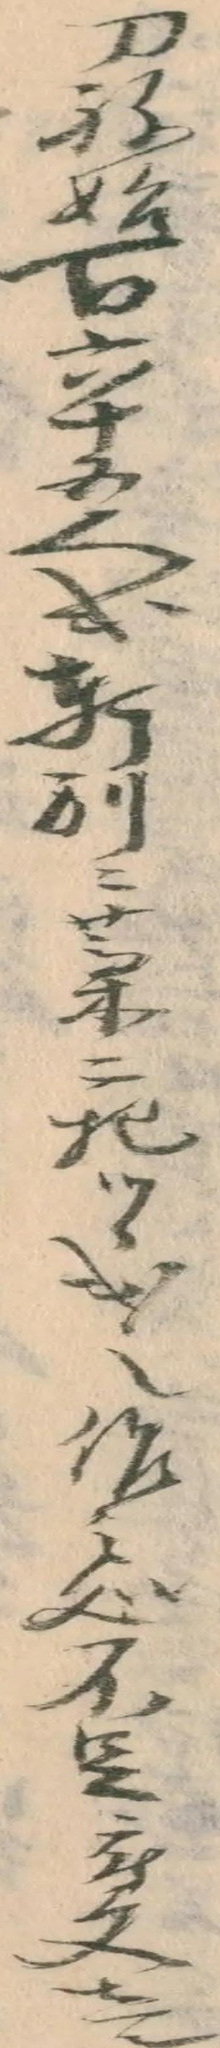刀祢始百六十五人出軒別に藁二把ツヽ出之候処不足ニ付又壱
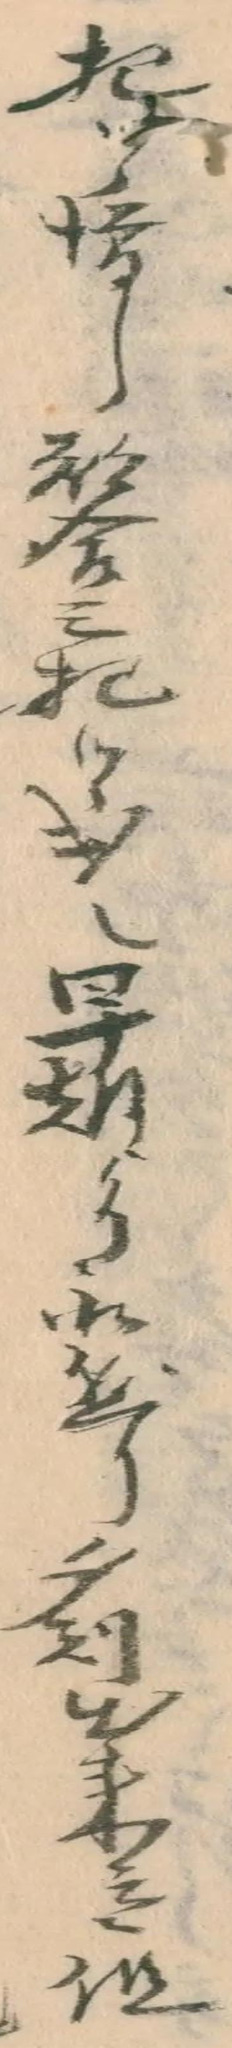把中増し都合三把握ツヽ出也早朝より取懸り夕刻出来云々但
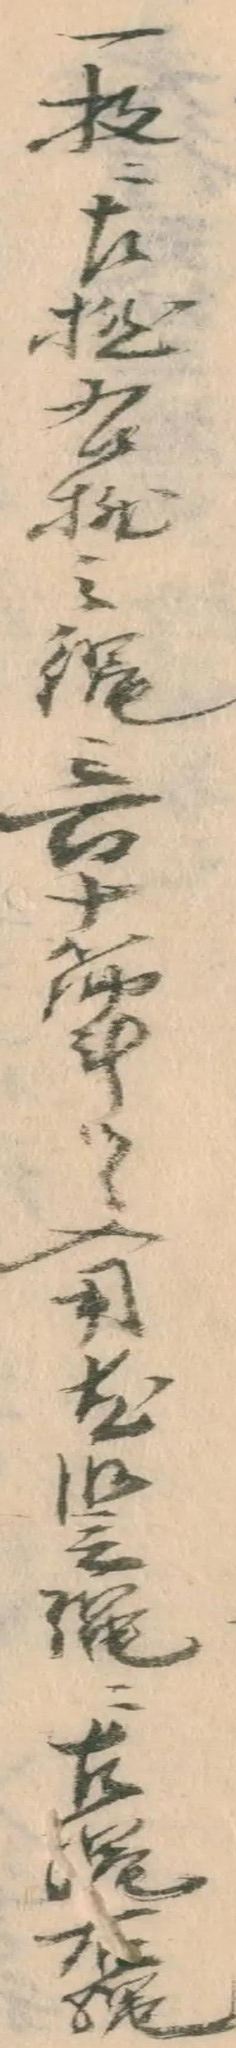一牧に左極右掛之縄三百十筋斗ツヽ入用尤竪縄に左縄右縄
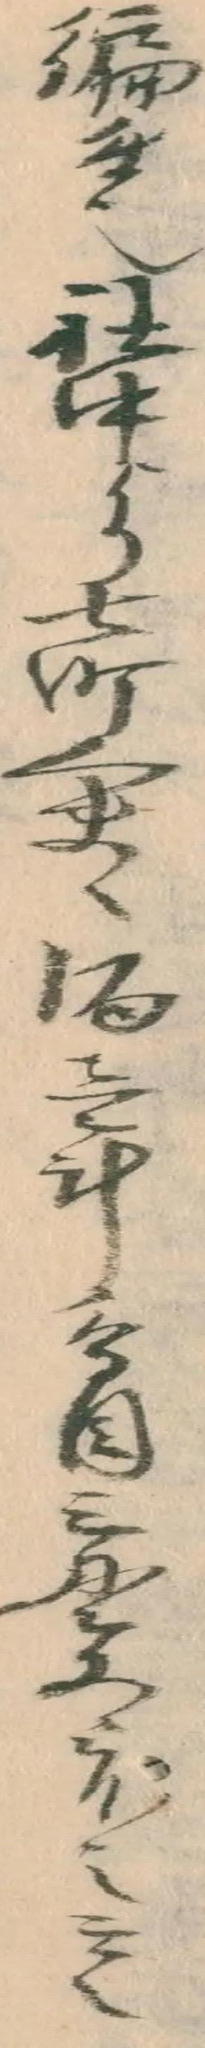編付也社中より七町人夫へ酒壱斗鳥目三貫文差之云々
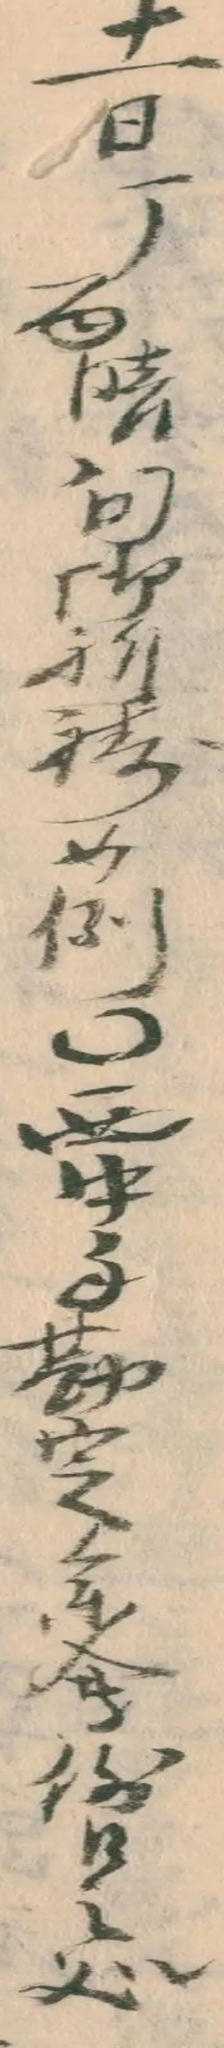十一日丁酉晴旬御祈祷如例〇西中手勘定参會例日之処
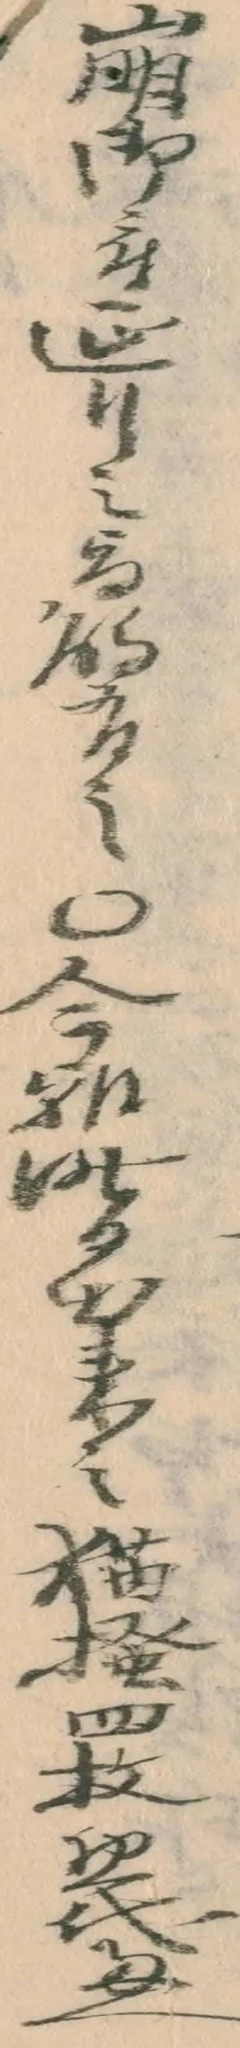崩御ニ付延引之旨觸有之○今朝昨日出来之猫掻四枚惣代両人
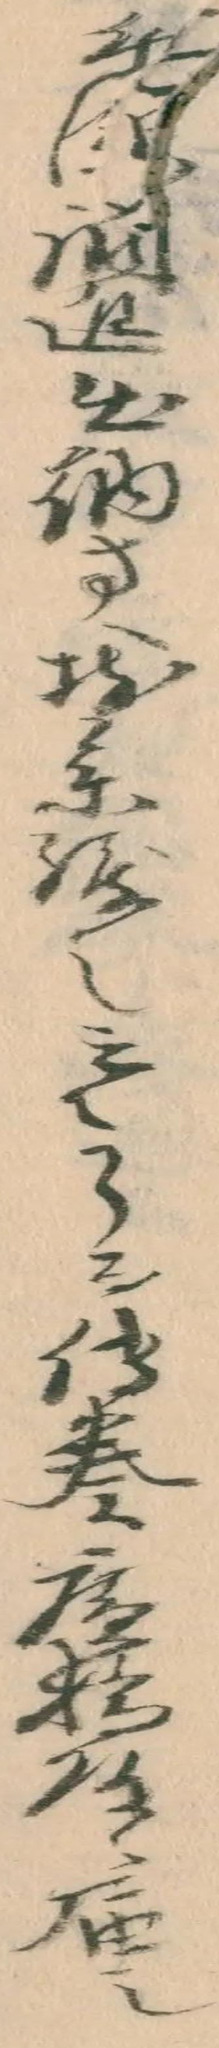出納方へ持参渡之云々了而傳奏廣橋殿へ届之
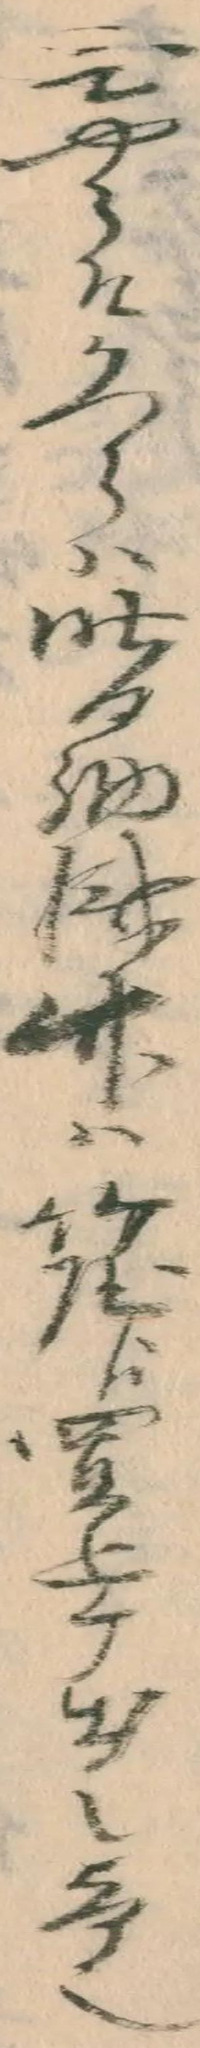ひやうそかつらハ昨日納済竹は竹屋ゟ買上ケ出之旨也
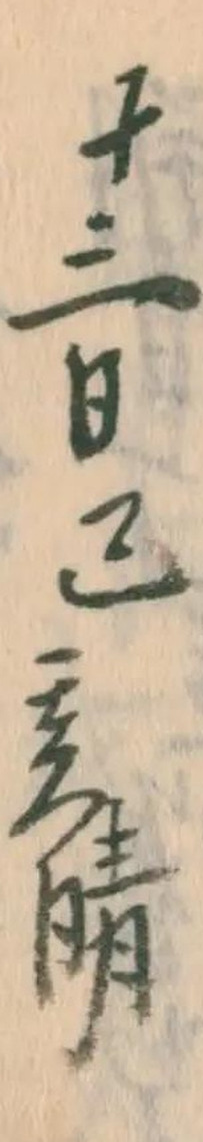十三日己亥晴
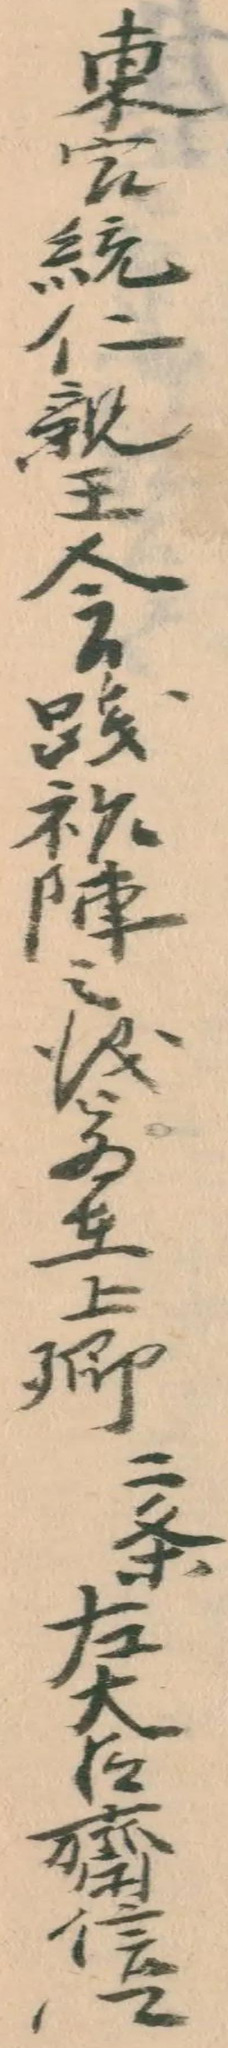東宮統仁親王今日践祚陣之儀被為在上卿二条左大臣齋信卿
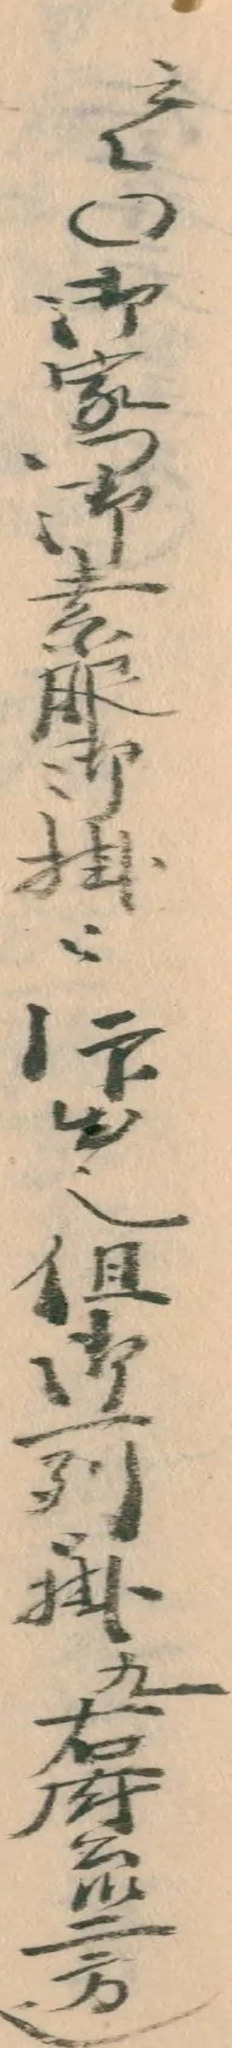云々○御家門御素服御掛被仰出也但御一列御掛九右府公御二方也
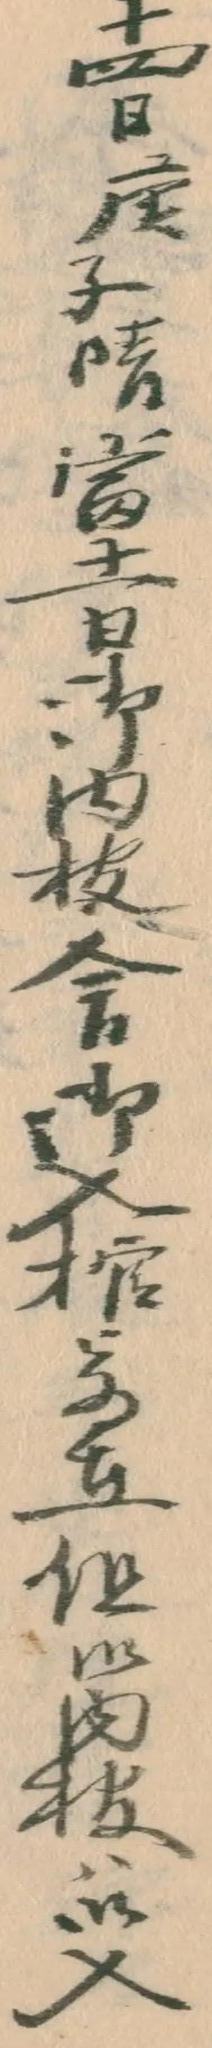十四日庚子晴當十一日御内棺今日御入棺被為在但御内棺ハ御入
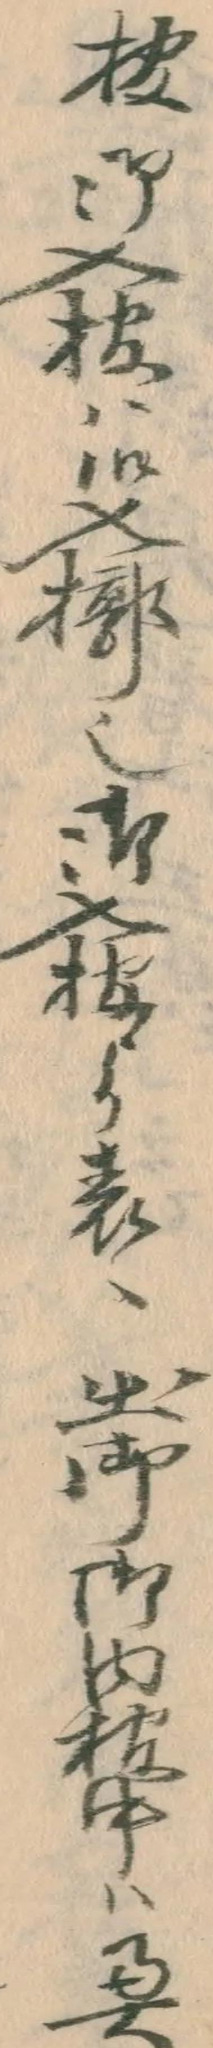棺御入棺ハ御入槨也御入棺より表へ出御御内棺中ハ奥
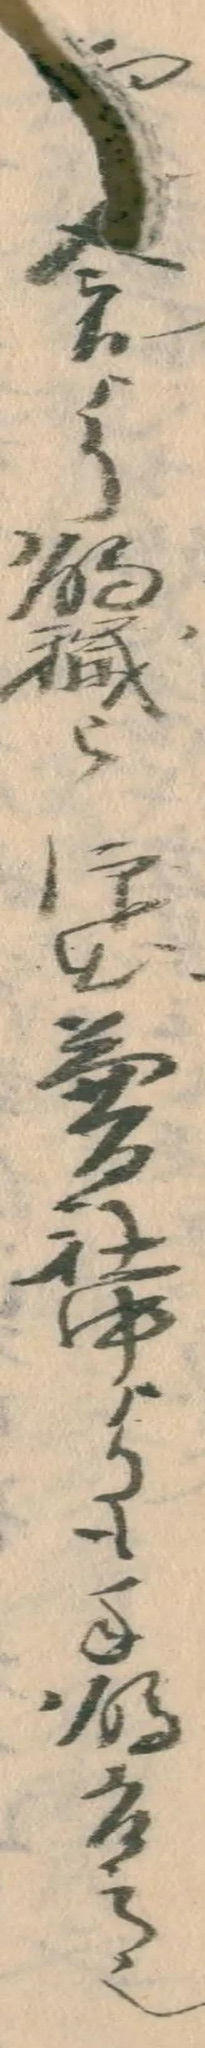向今日より觸穢被仰出兼而社中よりも手觸有之也
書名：賀茂社記録. 第70冊
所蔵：国立国会図書館 National Diet Library, JAPAN
